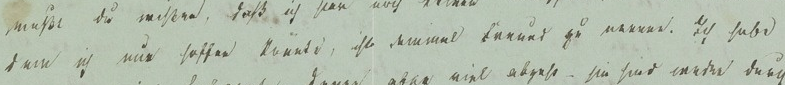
dem ich nur hoffen könnte, ihn einmal Freund zu nennen. Ich habe
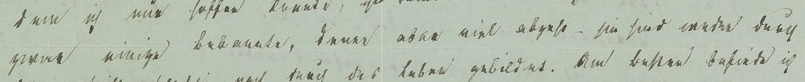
zwar einige Bekannte, denen aber viel abgeht – sie sind weder durch
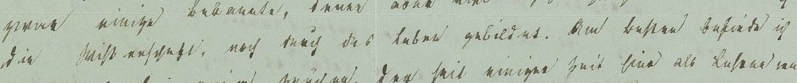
die Wißenschaft, noch durch das Leben gebildet. Am besten befinde ich
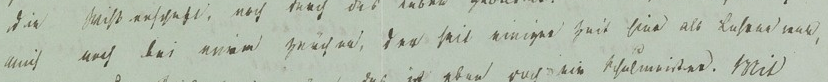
mich noch bei einem Zürcher, der seit einiger Zeit hier als Lehrer war,
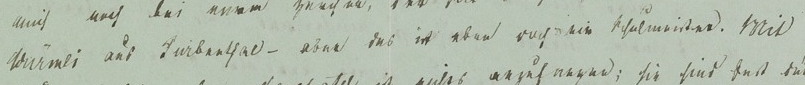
Würmli aus Turbenthal – aber das ist eben doch ein Schulmeister. Mit
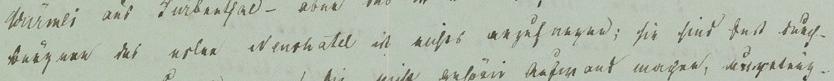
Bürgern des edlen Neuchâtel ist nichts anzufangen; sie sind fast durch-
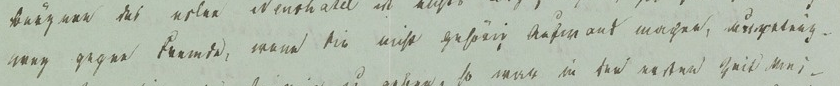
weg gegen Fremde, wenn sie nicht gehörig Aufwand machen, unverträg-
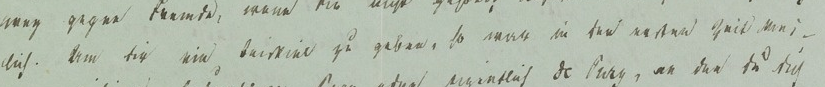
lich. Um dir ein Beispiel zu geben, so war in der ersten Zeit mei-
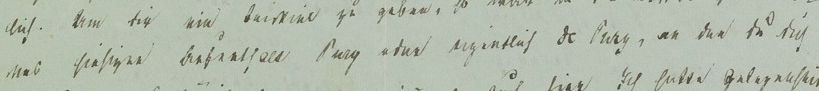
nes hiesigen Aufenthalt Pury oder eigentlich de Pury, an den du dich
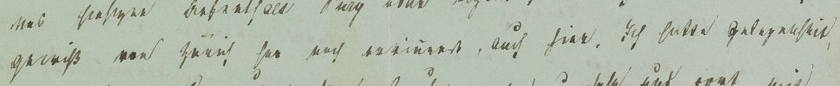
gewiß von Zürich her noch erinnerst, auch hier. Ich hatte Gelegenheit,
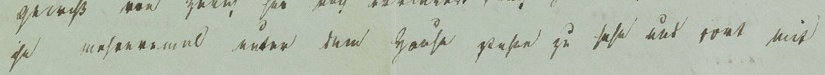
ihn mehreremal unter dem Hause stehen zu sehn und dort mit
